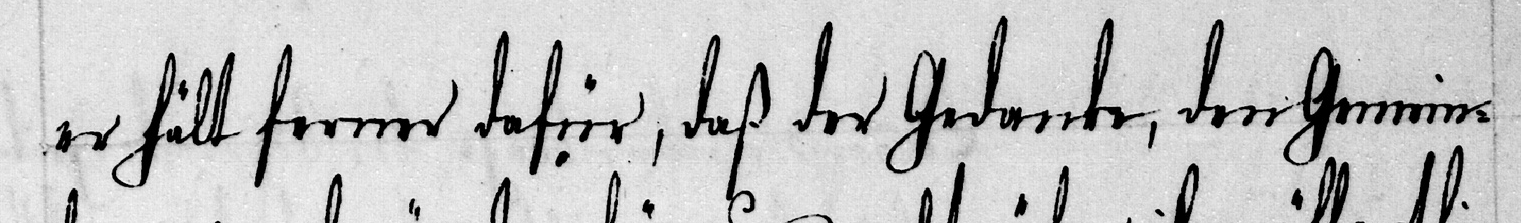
er hält ferner dafür, daß der Gedanke, den Gemein¬
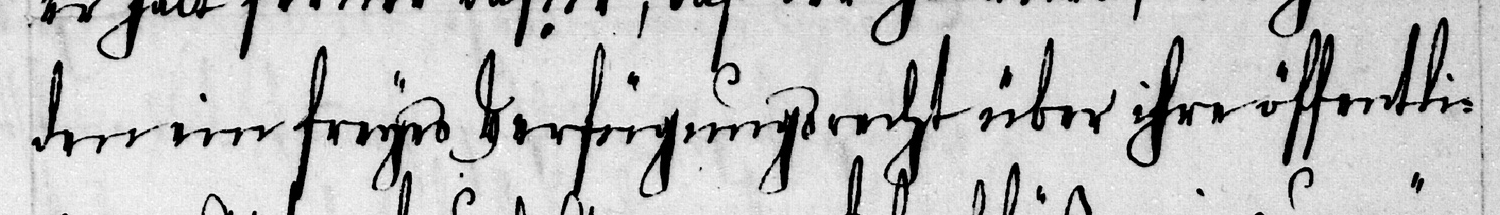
den ein freyes Verfügungsrecht über ihre öffentli¬
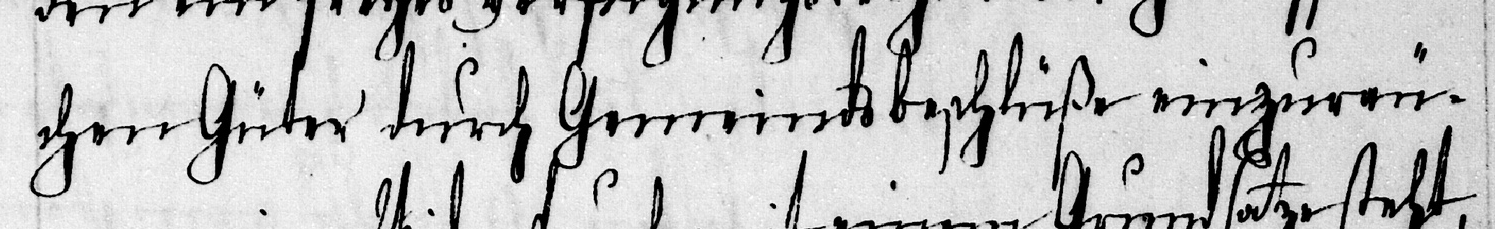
chen Güter durch Gemeindsbeschlüße einzuräu¬
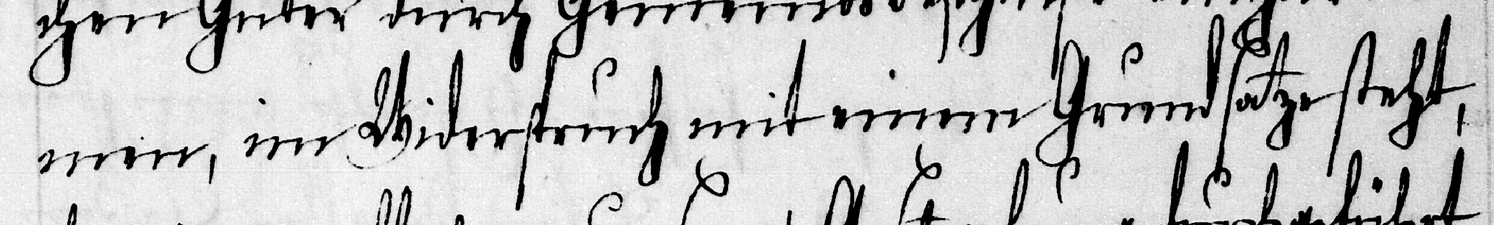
men, im Widerspruch mit einem Grundsatze steht,
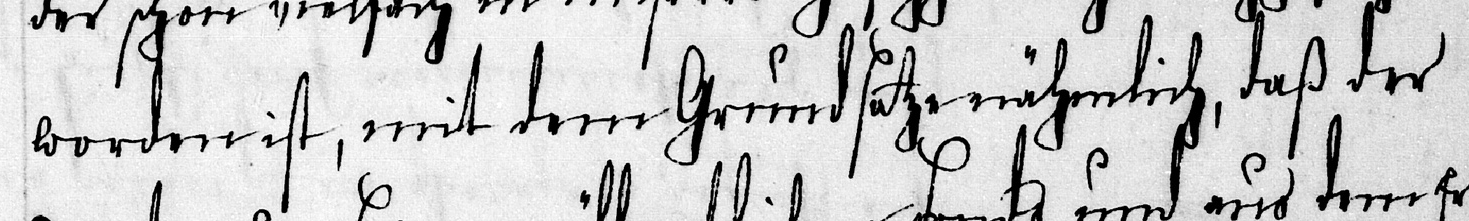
worden ist, mit dem Grundsatze nähmlich, daß der
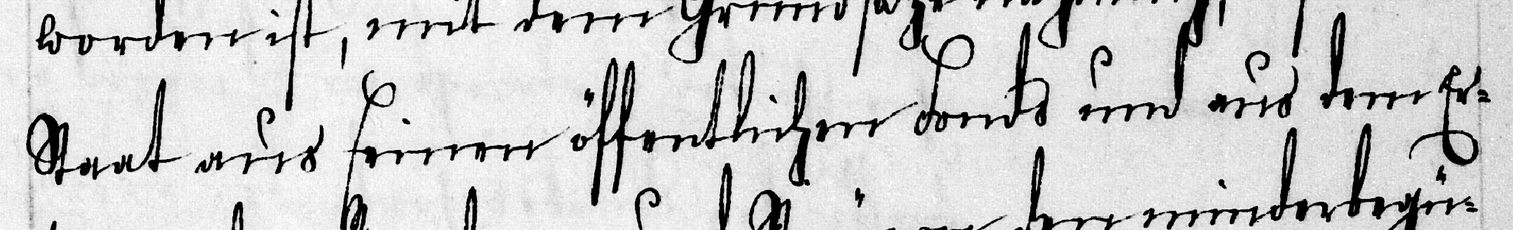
Staat aus seinen öffentlichen Fonds und aus dem Er¬
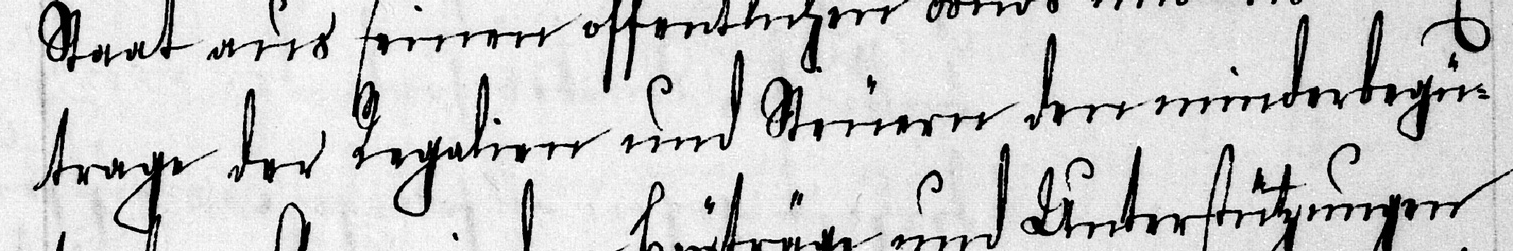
trage der Regalien und Steuern den minderbegü¬
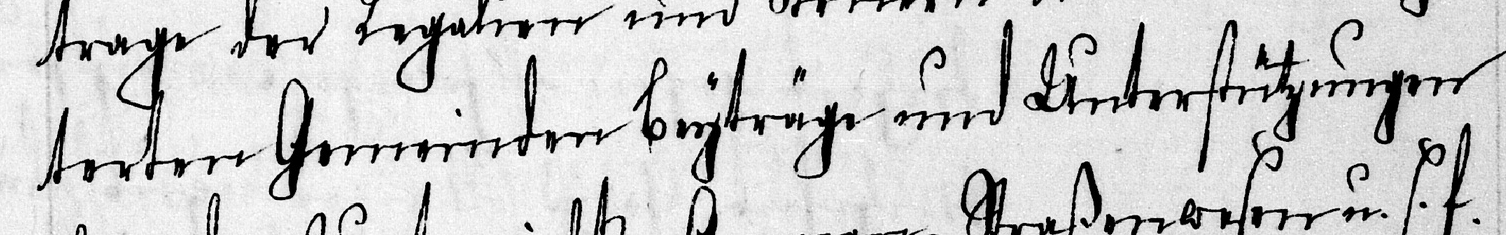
terten Gemeinden Beyträge und Unterstützungen
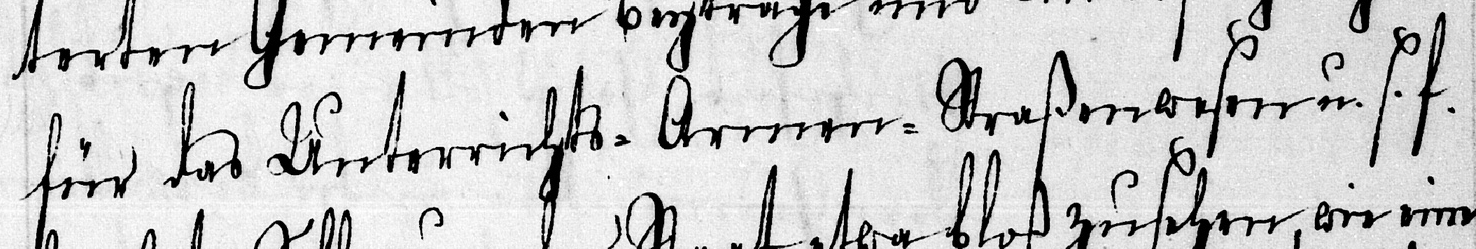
für das Unterrichts- Armen- Straßenwesen u. s. f.
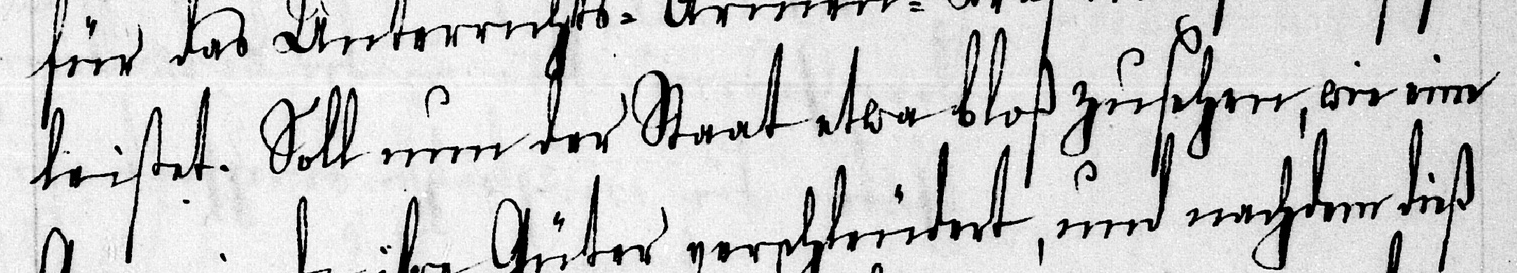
leistet. Soll nun der Staat etwa bloß zusehen, wie eine
